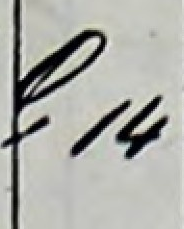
0,14
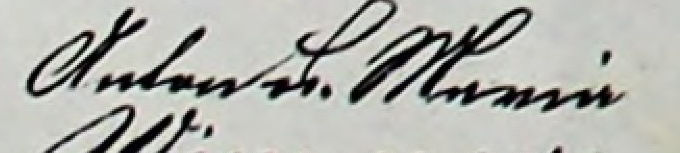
Anton u. Maria
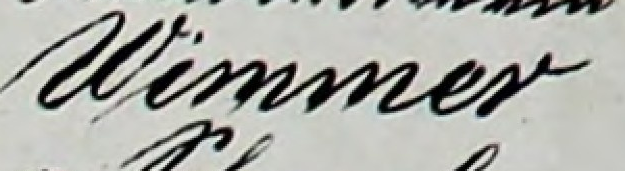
Wimmer
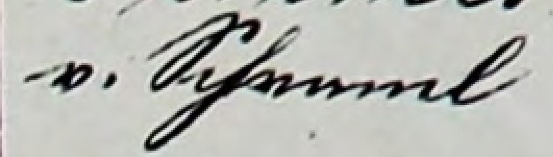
v. Schraml
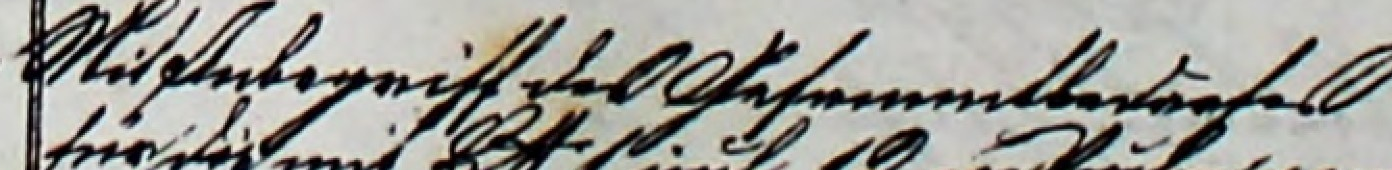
Mit Inbegriff des Gesammtbedarfes
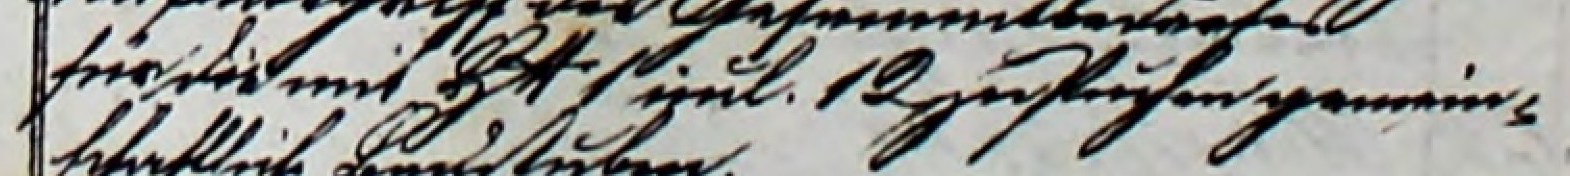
für die mit H? 1 inil. 12 zu Puchen gemein„
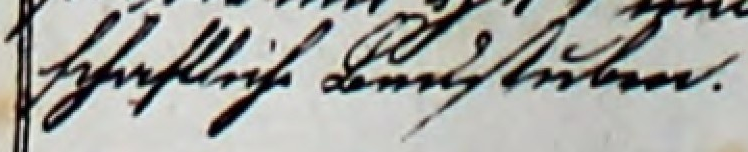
schaftliche Badstuben.
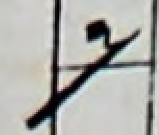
7
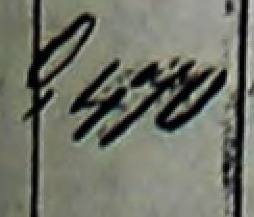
0,470
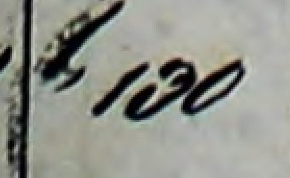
0,130
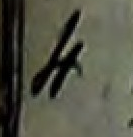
4
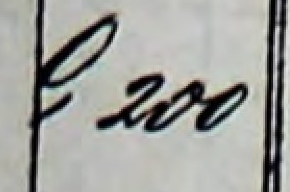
0,200
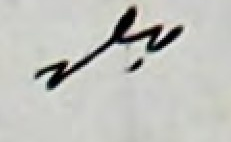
do
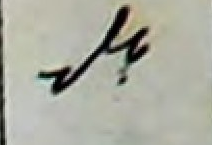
do
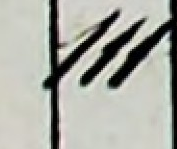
111
